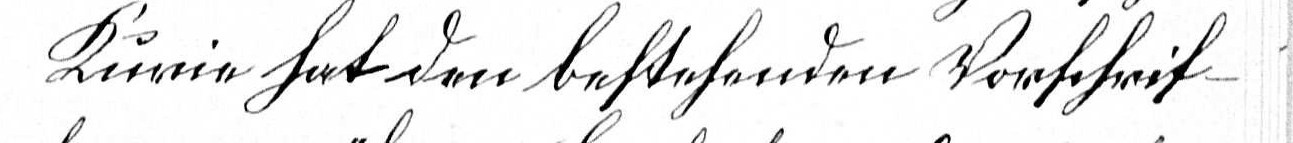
Kurie hat den bestehenden Vorschrif¬
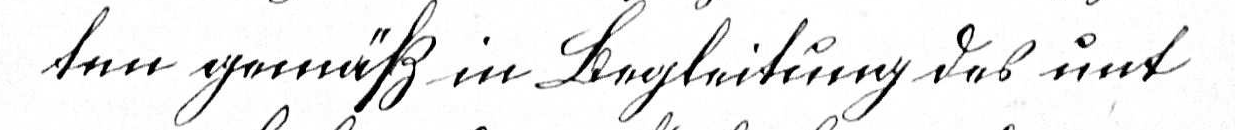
ten gemäß in Begleitung des unt
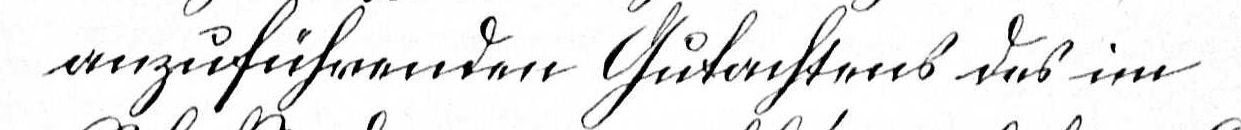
anzuführenden Gutachtens des im
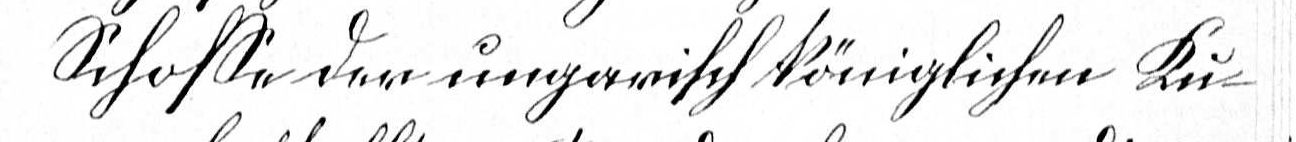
Schoße der ungarisch königlichen Ku¬
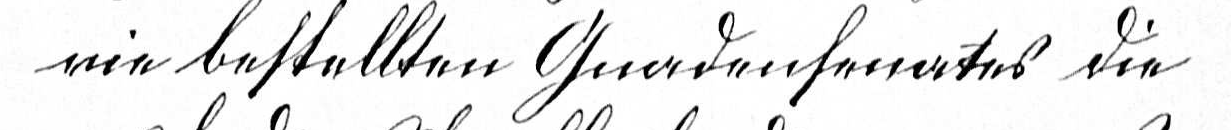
rie bestellten Gnadensenates die
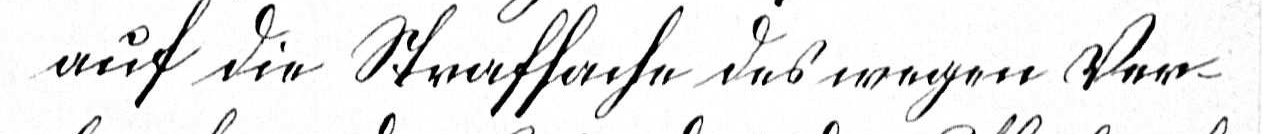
auf die Strafsache des wegen Ver¬
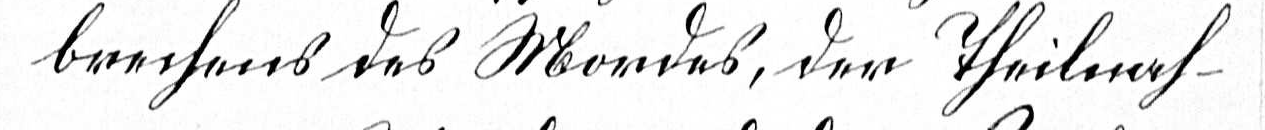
brechens des Mordes, Theilnah¬
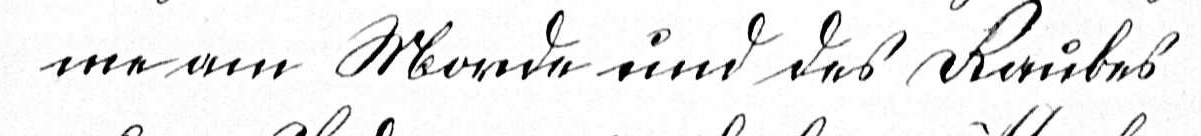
me am Morde und des Raubes
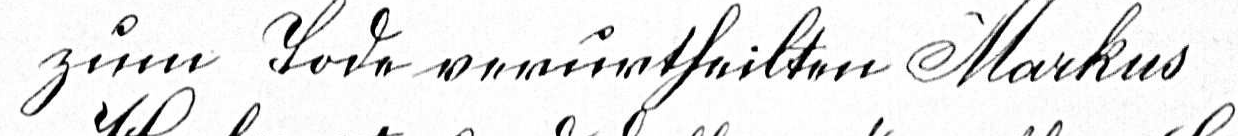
zum Tode verurtheilten Markus
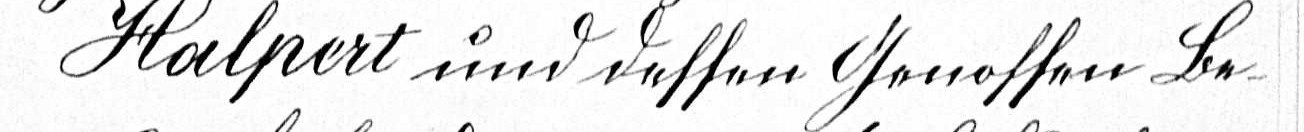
Halpert und dessen Genossen Be¬
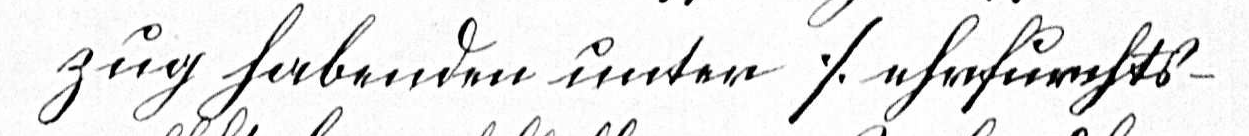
zug habenden unter ./. ehrfurchts¬
